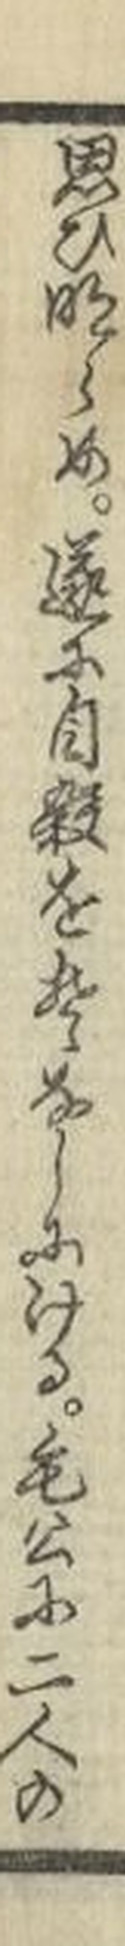思ひ明らめ。遂に自殺をそなしにける。毛公に二人の
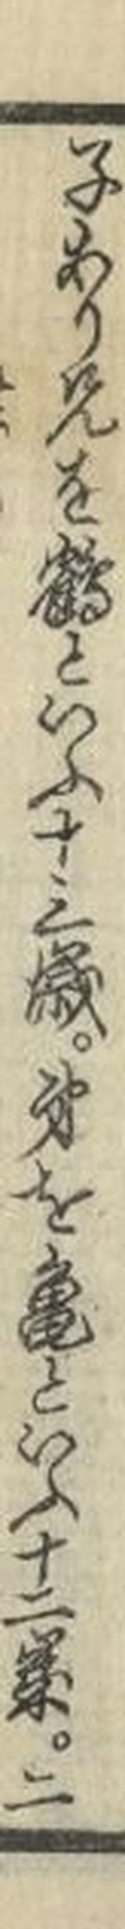子あり兄を鶴といふ十三歳。弟を亀といふ十二歳。二
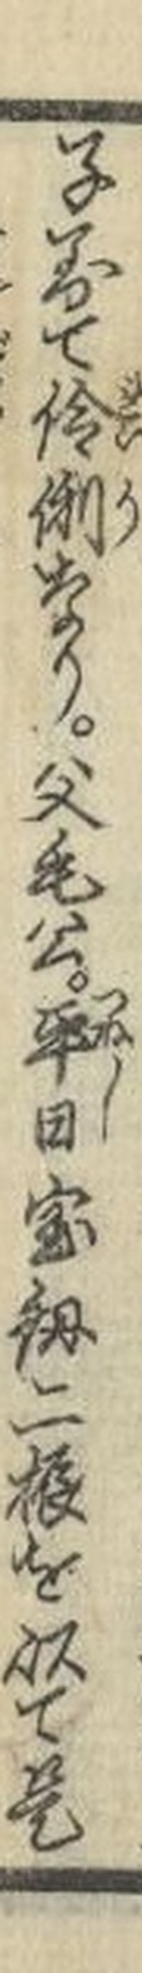子至て伶俐なり。父毛公。平日宝剣二振を以て是
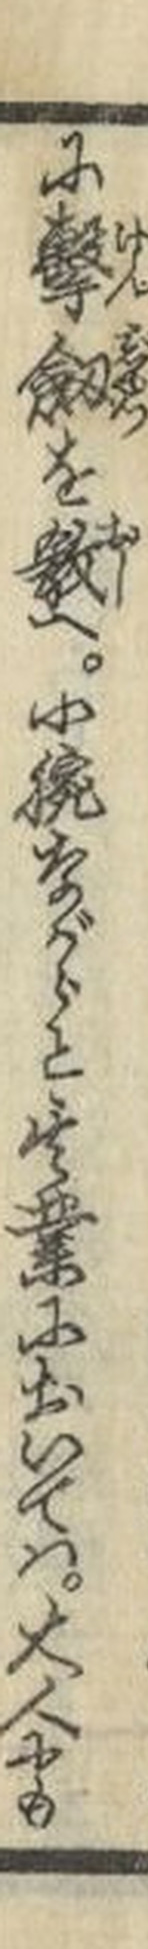に撃剣を教へ。小腕ながらも其業においては。大人にも
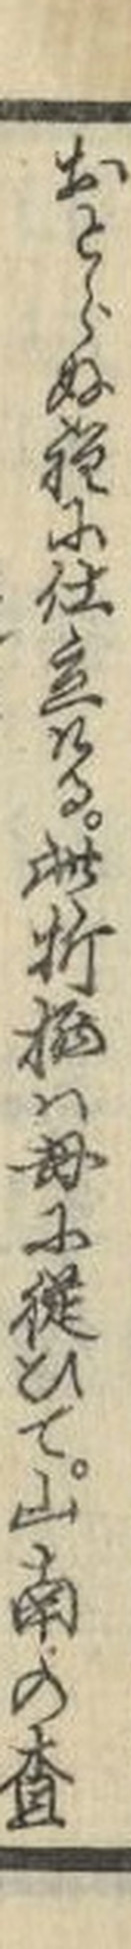おとらぬ程に仕立ける。此折柄は母に従ひて。山南の査
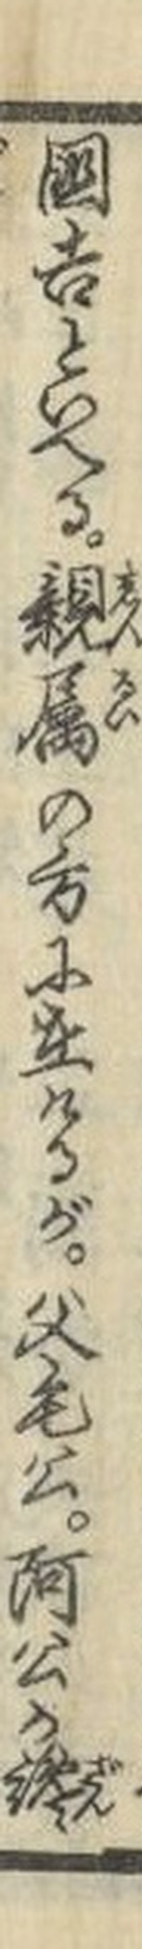国吉といへる。親属の方に在けるが。父毛公。阿公か讒
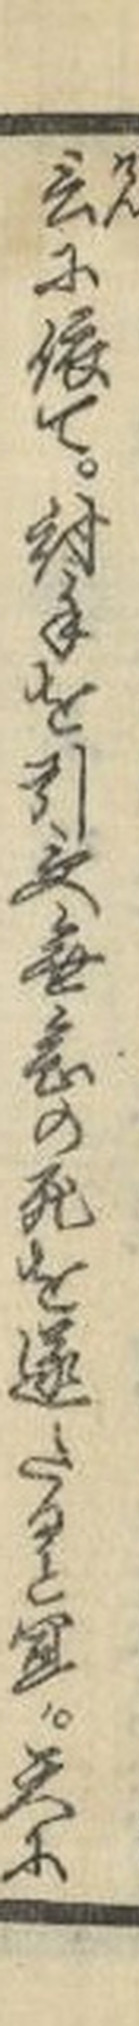言に依て。討手を引受無念の死を遂たると聞。天に
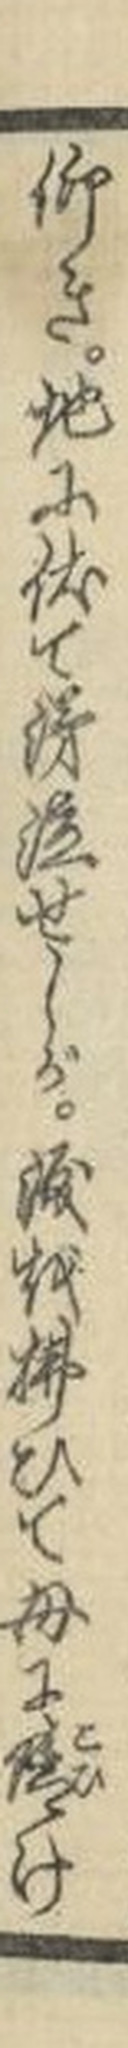仰き。地に伏て涕泣せしが。涙を払ひて母に請け
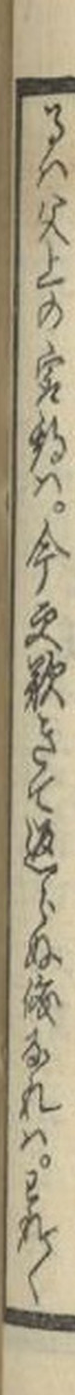るは父上の最期は。今更歎きて返らぬ儀なれは。われ〳〵
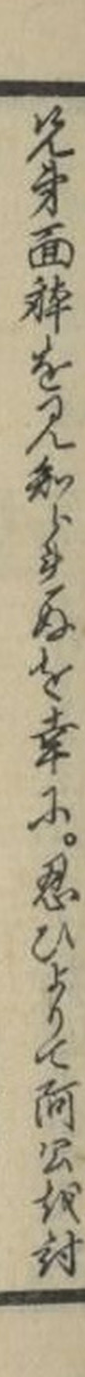兄弟面体を見知られぬを幸に。忍ひよりて阿公を討
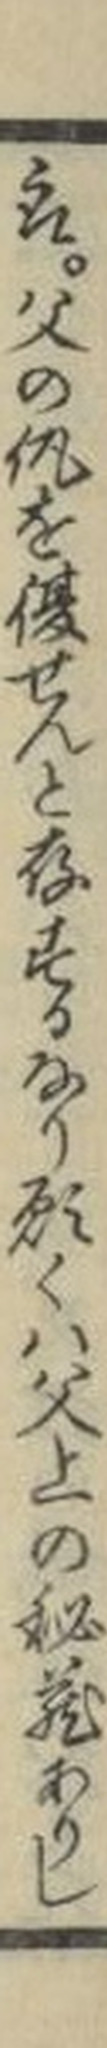取。父の仇を復せんと存するなり願くは父上の秘蔵ありし
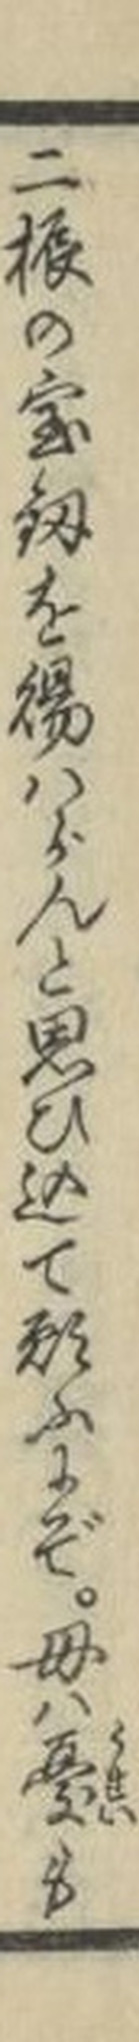二振の宝剣を賜はらんと思ひ込て願ふにぞ。母は憂も
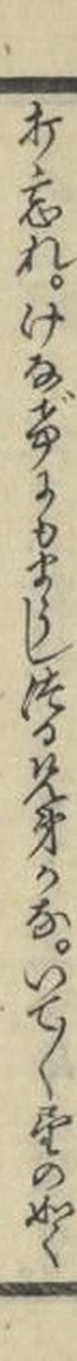打忘れ。けなげにもまうしつる兄弟かな。いて〳〵望の如く
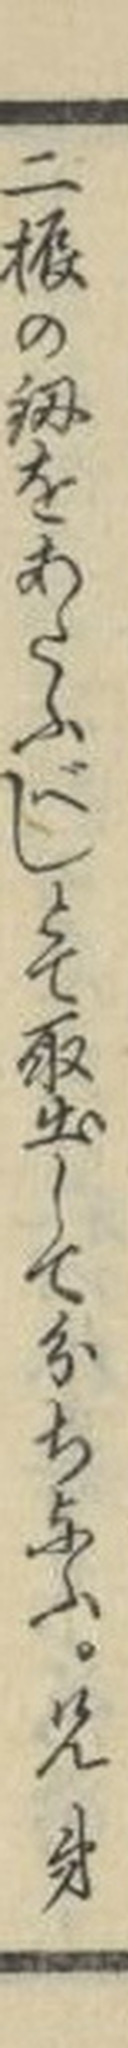二振の剣をあたふべしとて取出して分ち与ふ。兄弟
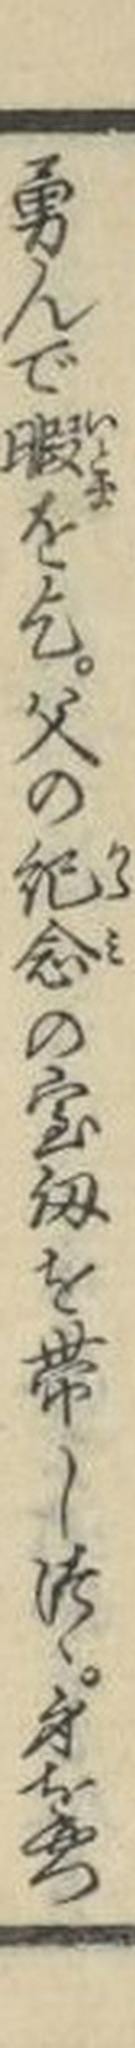勇んで暇を乞。父の記念の宝剣を帯しつゝ。身をやつ
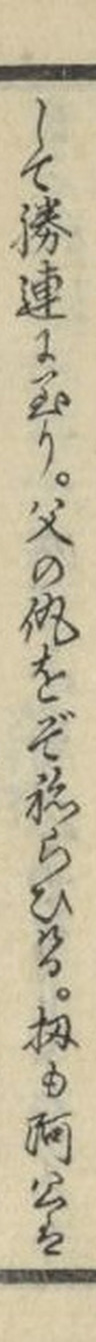して勝連に至り。父の仇をぞねらひける。扨も阿公は
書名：琉球解語
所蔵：University of the Ryukyus Library
